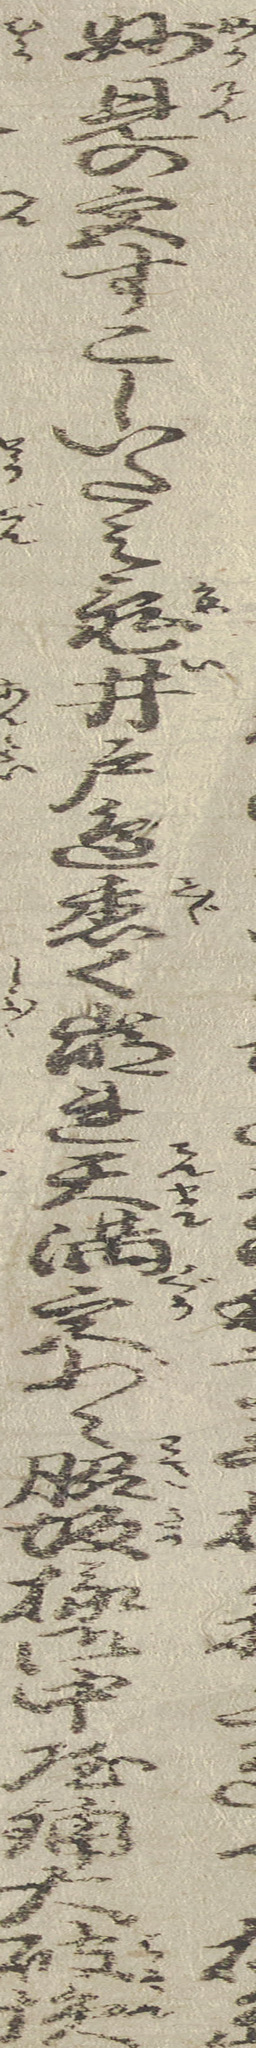妙見の宮すこしいたミ亀井戸邊悉く崩れ天満宮少〻脇坂様御中屋鋪大破損
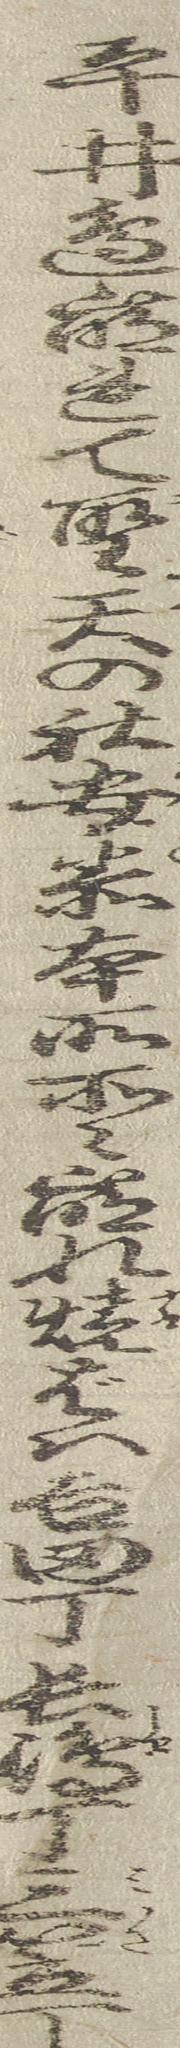平井邊崩れて聖天の社安泰本所所〻崩れ焼ばハ吉田丁長嶋丁三笠丁井上様
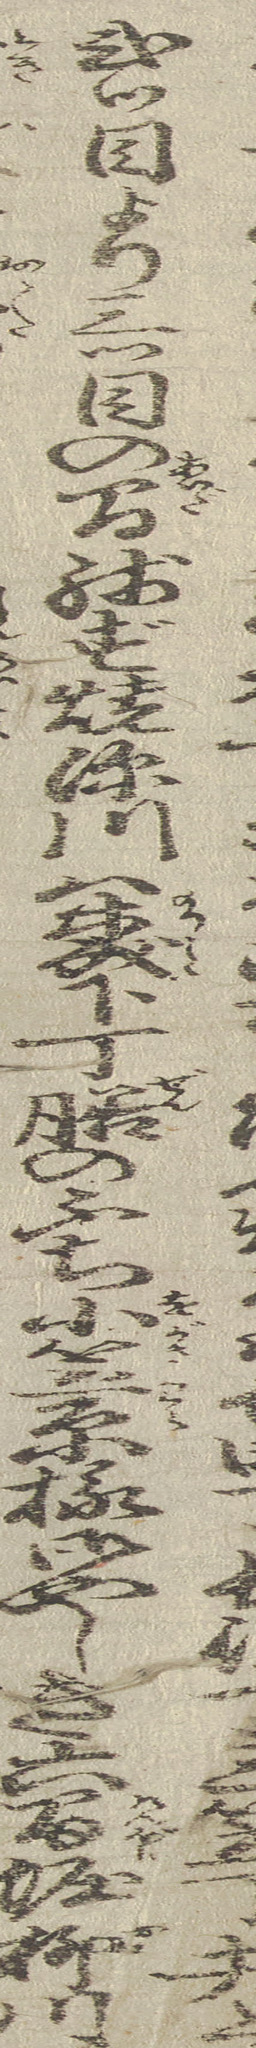弐ツ目より三ツ目の間残ず焼深川ハ森下丁膳のふち小笠原様御やしき六間堀柳川丁
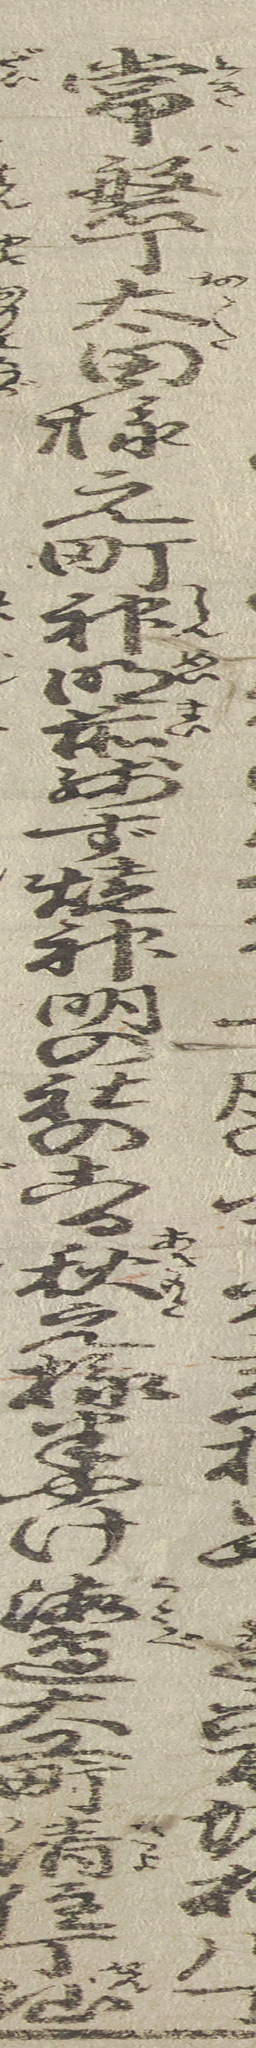常磐丁太田様元町神明前残ず焼神明の社のこる秋元様半やけ海邊大工町清住丁仙
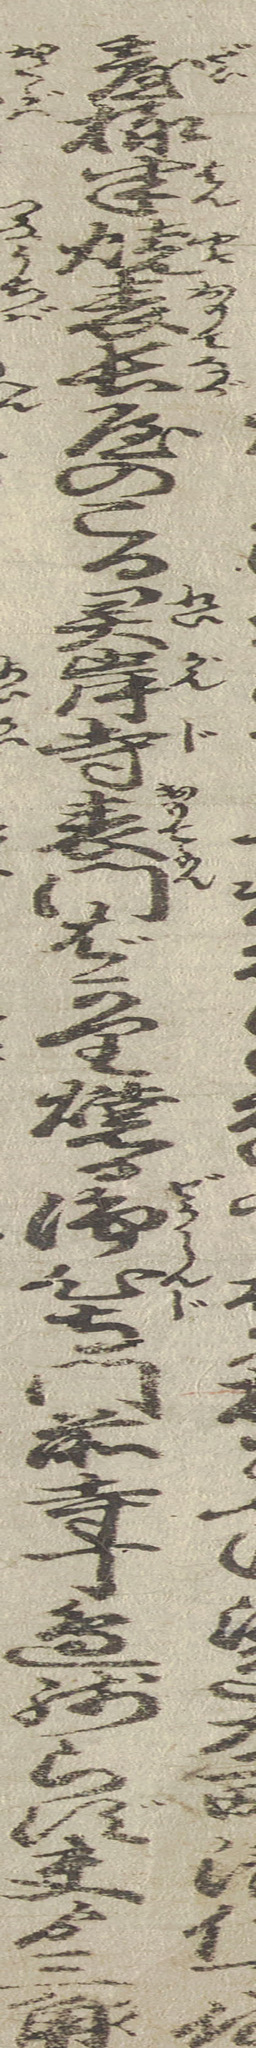臺様半焼表長屋のこる㚑岸寺表門ばかり焼る浄心寺門前寺丁邊残らず夫ゟ三角
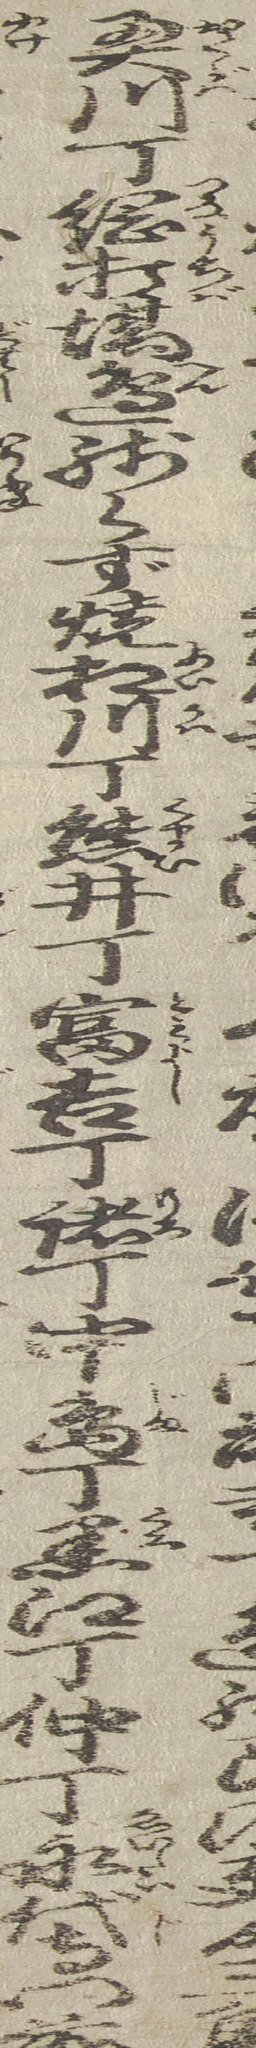奥川丁綱打場邊残らず焼相川丁熊井丁富吉丁諸丁中島丁黒江丁仲丁永代寺門前
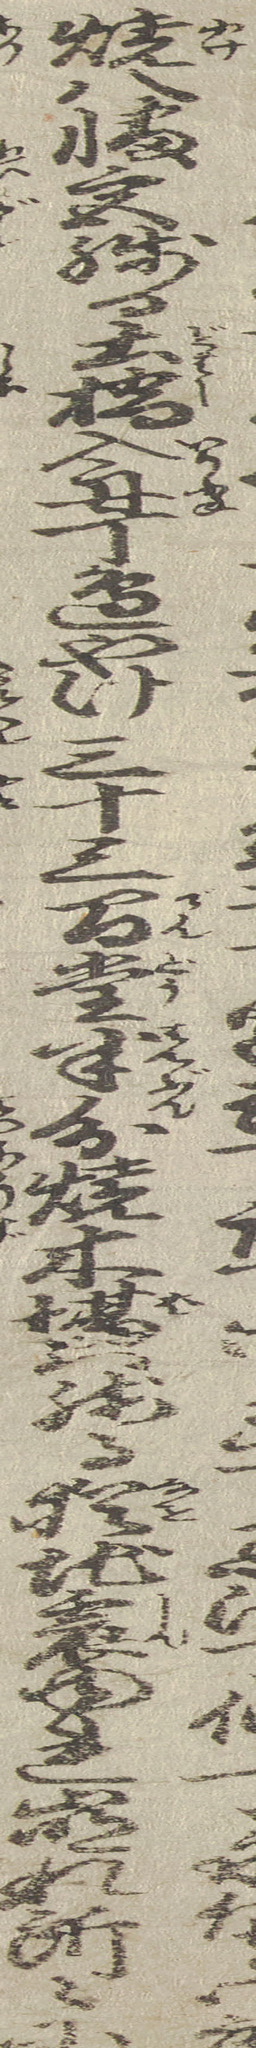焼八幡宮残る土橋入舟丁邊やけ三十三間堂半分焼木場ハ残る猶地震ゆれ崩れ所〻に
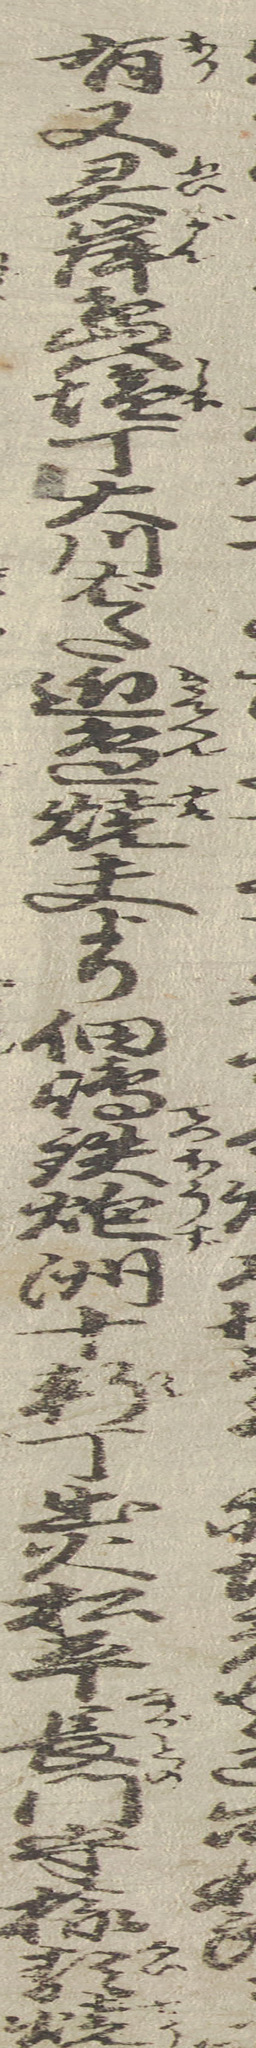有又㚑岸島塩丁大川ばた近邊焼夫より佃嶋鉄炮州十軒丁出火松平長門守様類焼
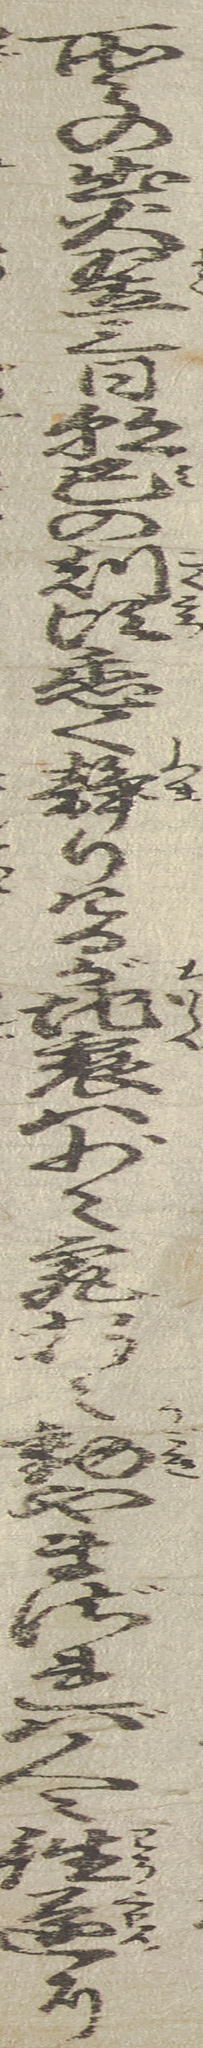所〻の出火翌三日朝巳の刻頃悉く静りたるが地震ハ少〻宛数〻動やまざれバ人〻往還に
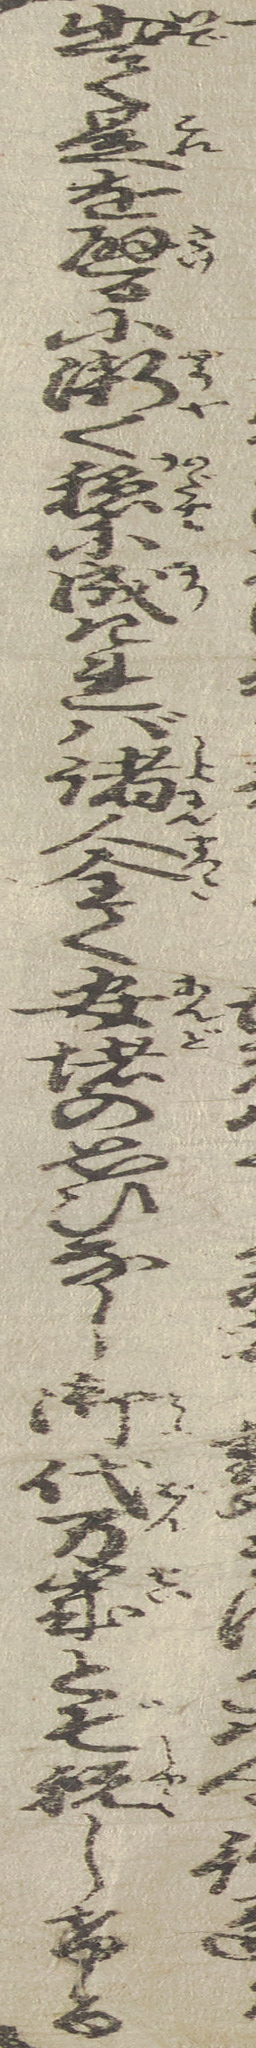出て是を避るに漸く穏に成けれバ諸人全く安堵の思ひなし御代万歳とぞ祝しける
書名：ゆるがぬ御代要之石寿栄
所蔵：東京大学総合図書館 General Library in the University of Tokyo, JAPAN
